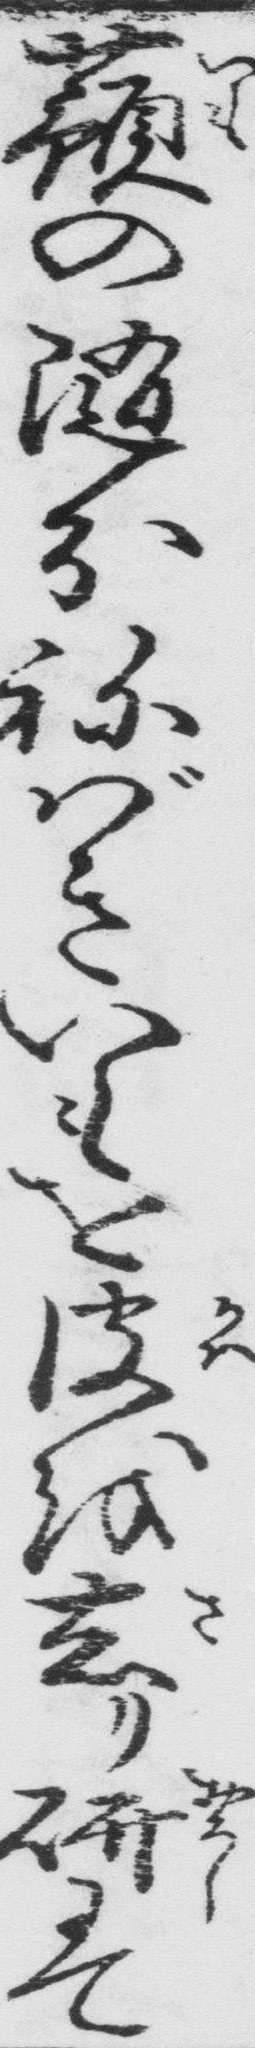蕷の随分ねばきいもを皮を去り研にて
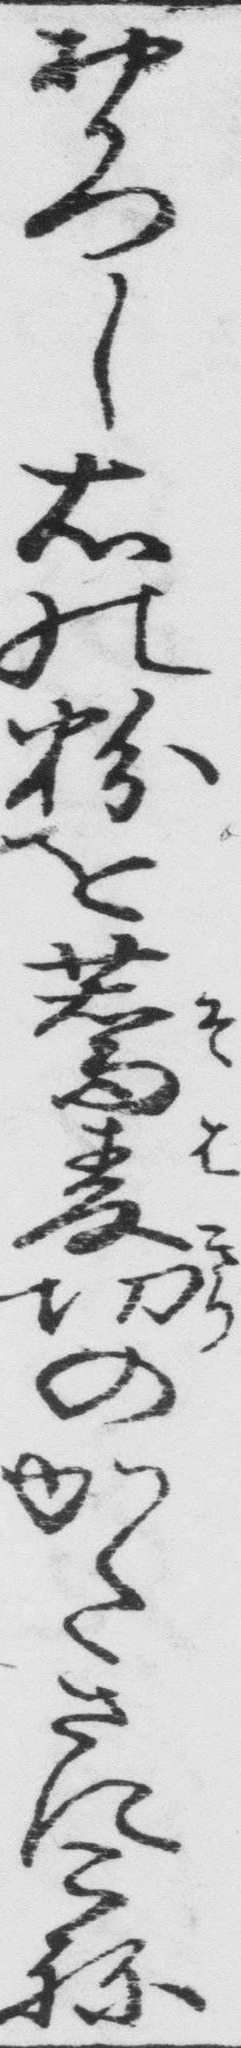おろし右の粉を蕎麦切のかたさにこね
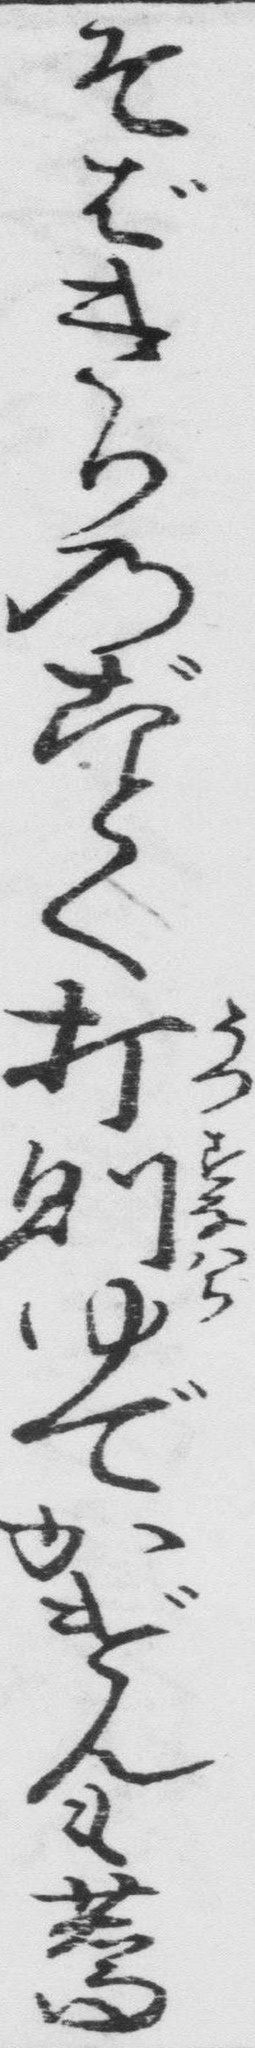そばきりのごとく打則ゆでかげんも蕎
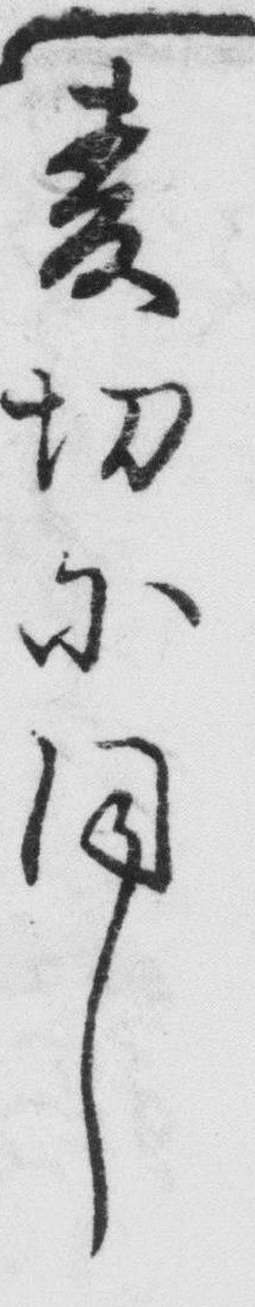麦切に同し
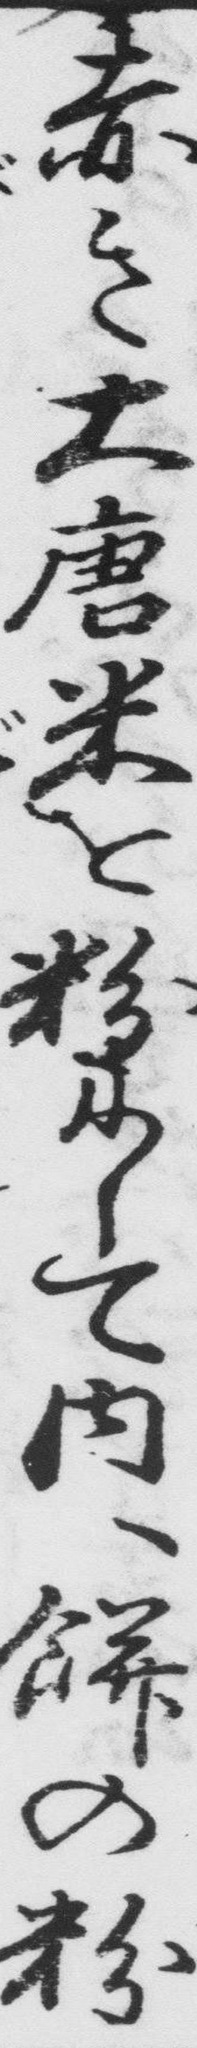赤き大唐米を粉にして内へ餅の粉
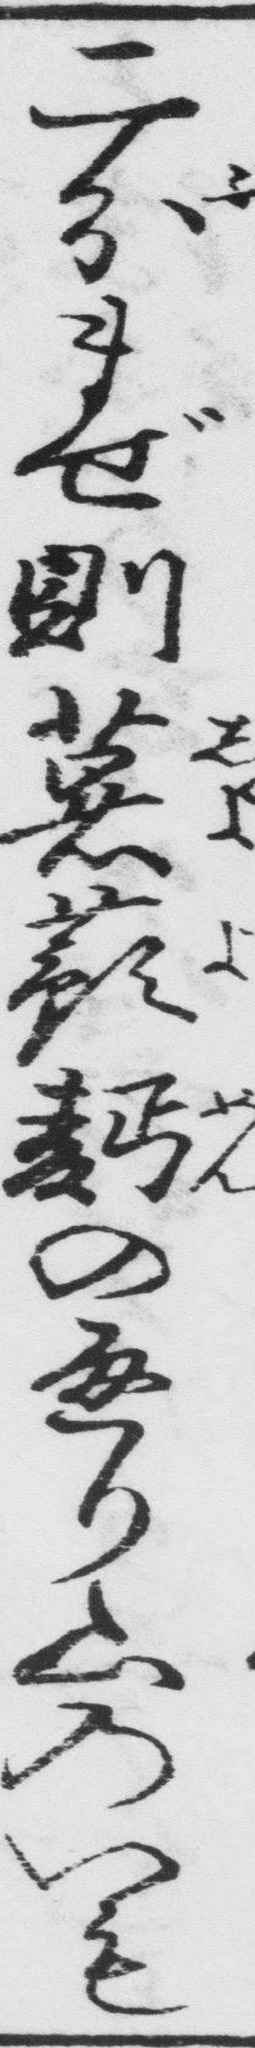二分まぜ則薯蕷麪の通り山のいも
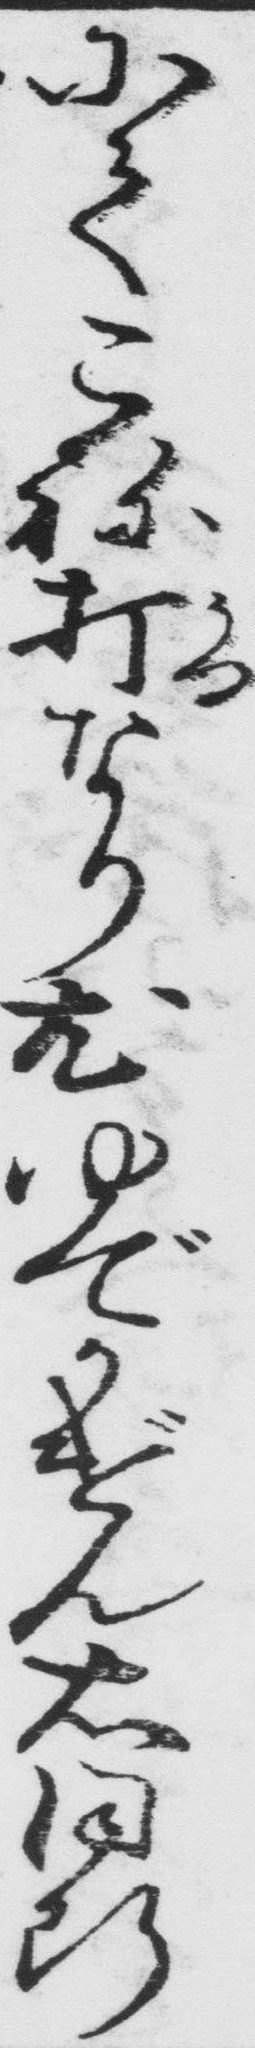にてこね打なり尤ゆでかげん右同断
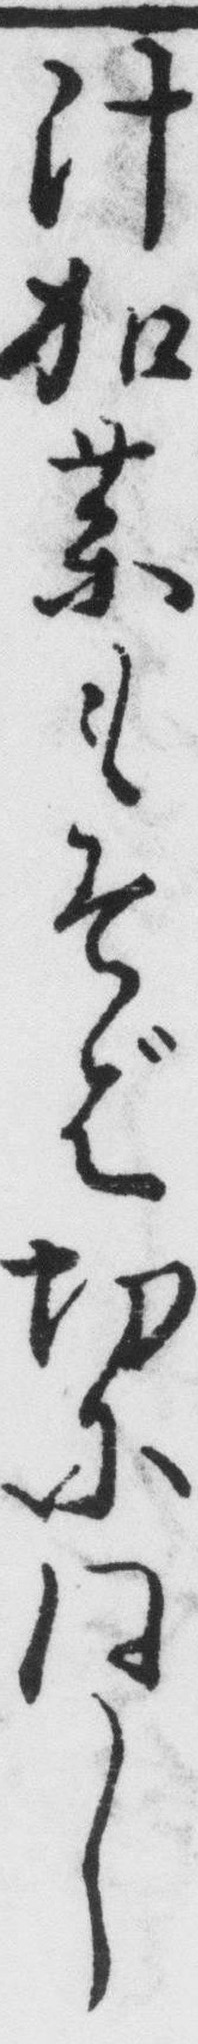汁加薬もそば切に同し
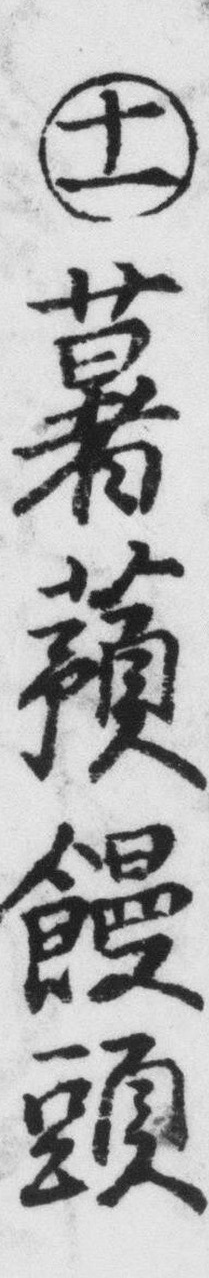(十一)薯蕷饅頭

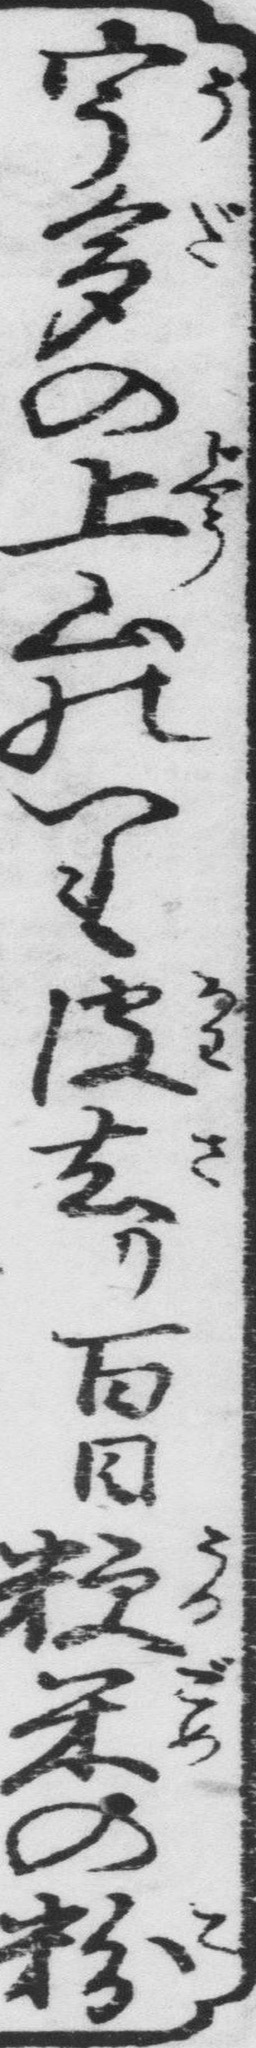宇多の上山のいも皮去り百目粳米の粉
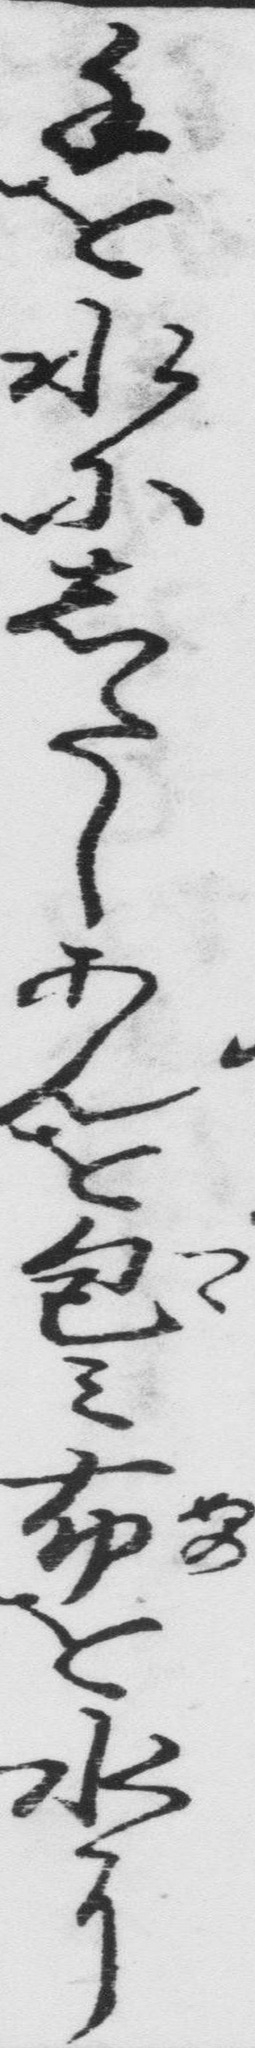手を水にしたしあんを包み布を水に
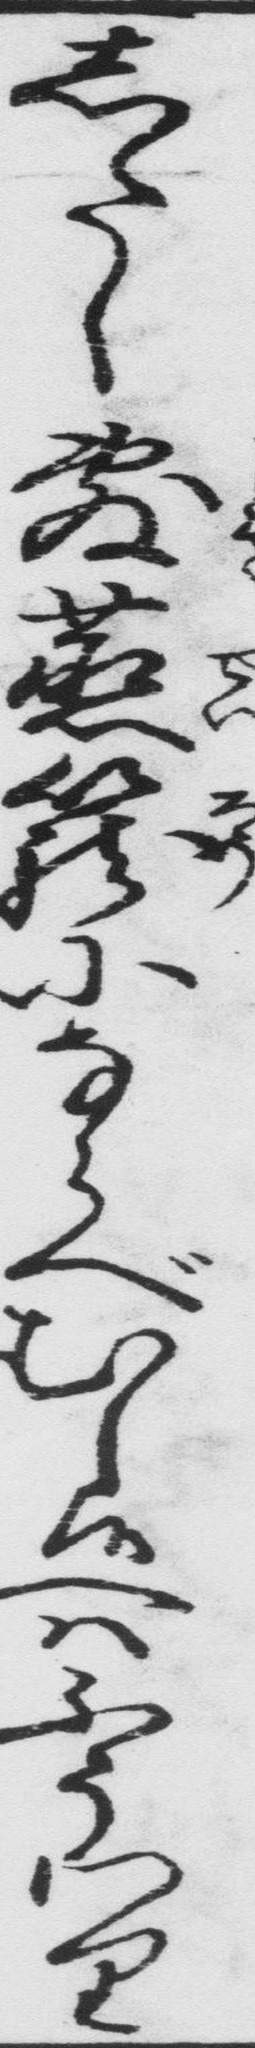したし敷蒸籠にならべむし候へはふうわり
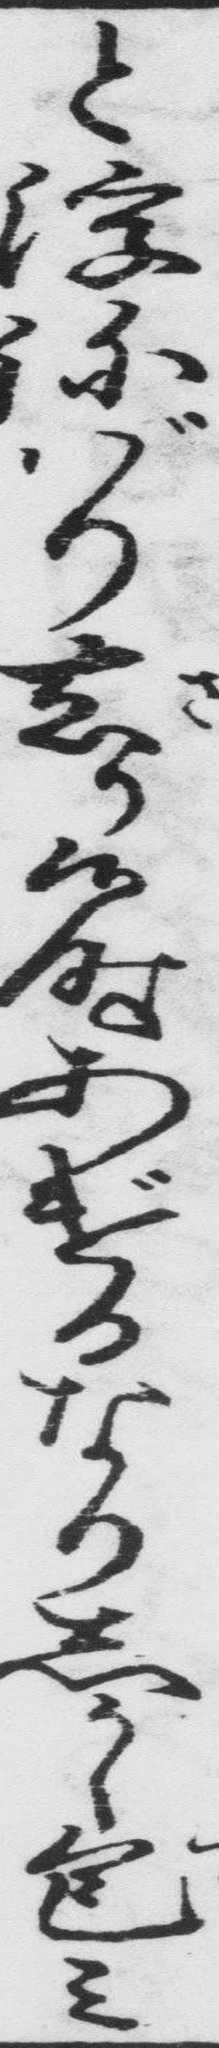と浮ねばり去り候時あげるなりしかし包み
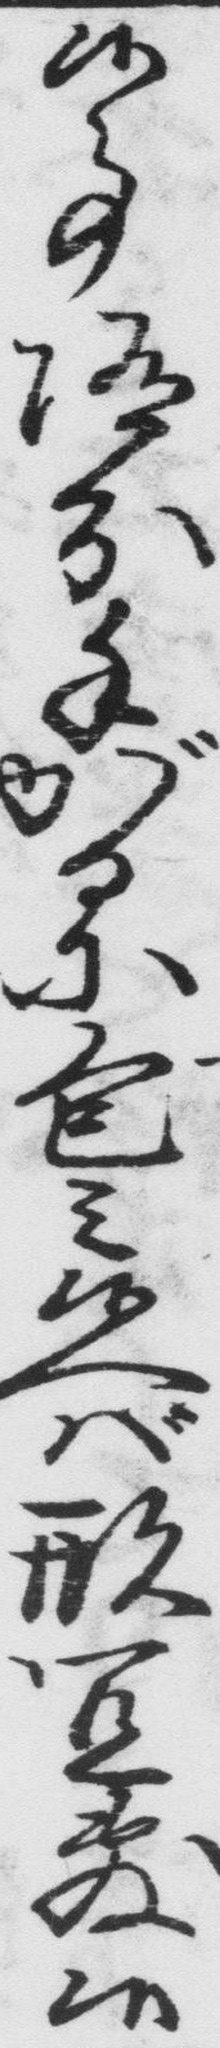候事随分手がるに包み候へば形宜敷候
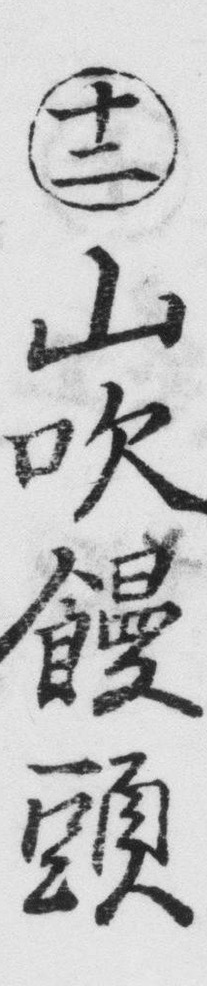(十二)山吹饅頭
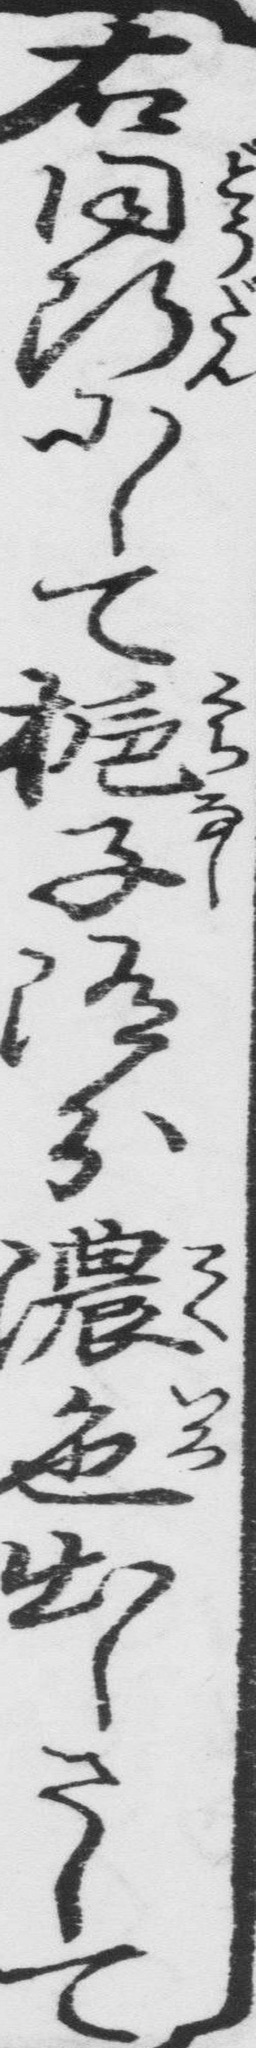右同断にして梔子随分濃色出しさして
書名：御前菓子図式
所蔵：大阪府立大学学術情報センター 国文学研究資料館
